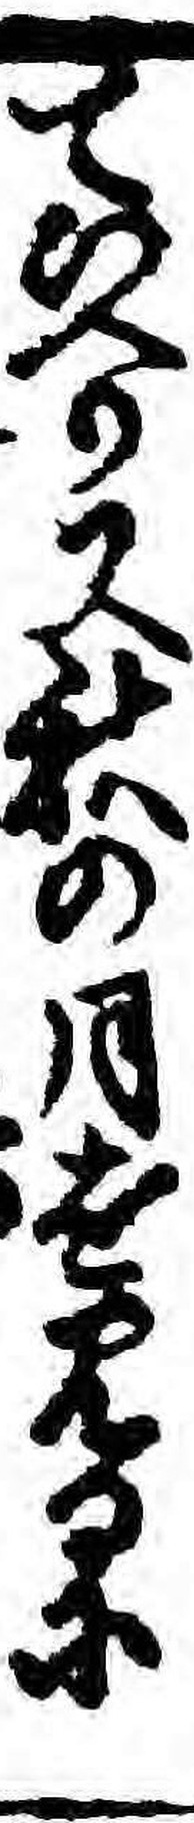ていへり又秋の月を見るに
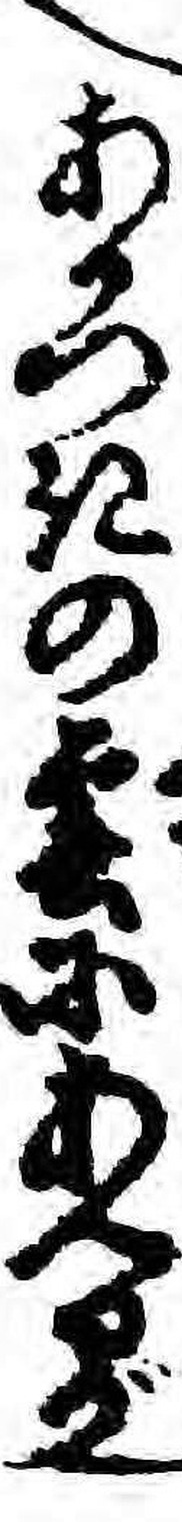あかつきの雲にあへるが
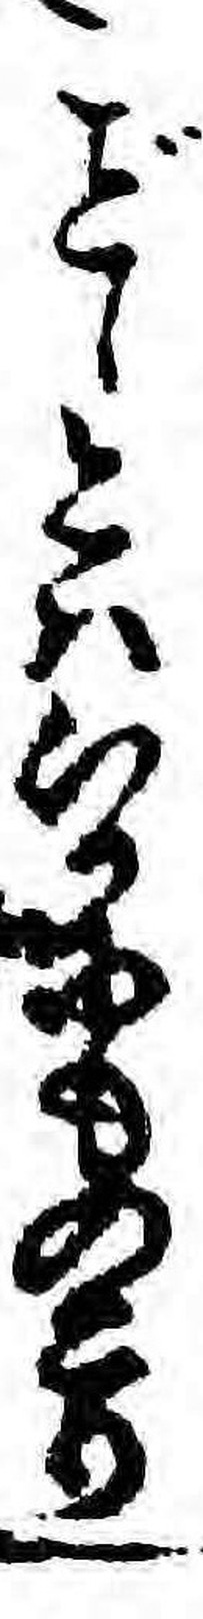ごとしとはいかにものこり
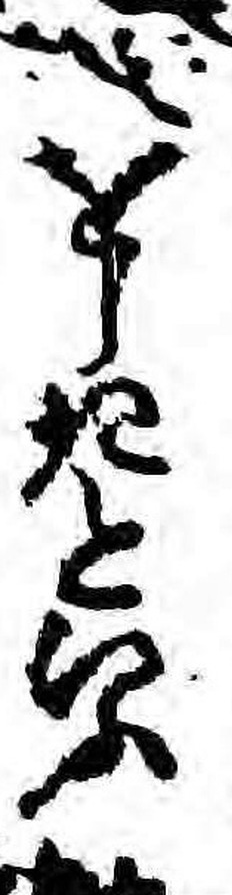をしきといふ
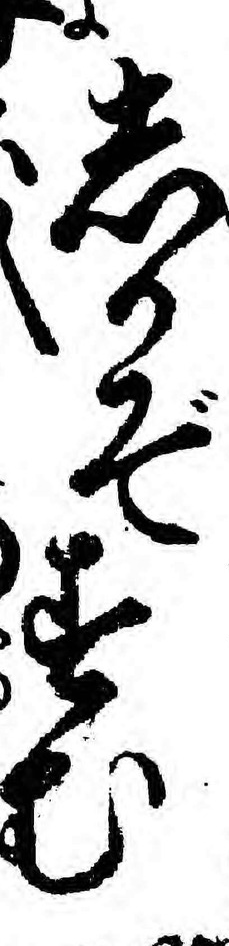しかぞすむ
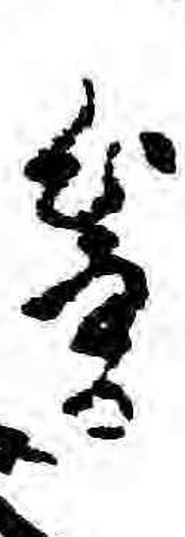心なる
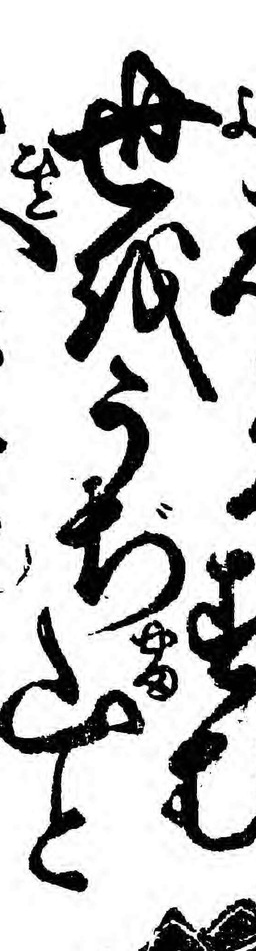世をうぢ山と
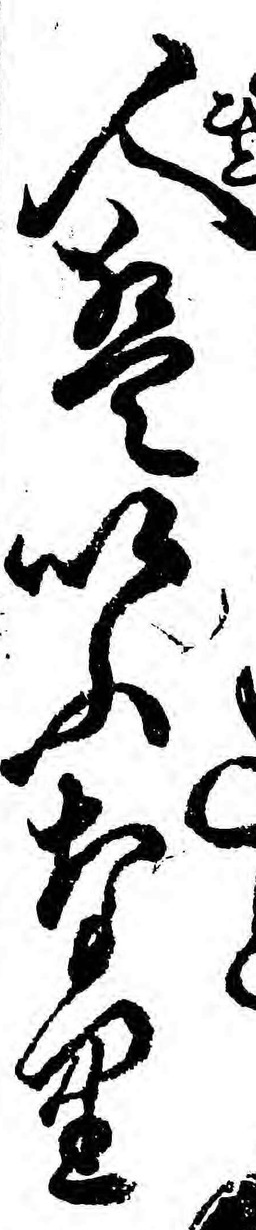人はいふなり
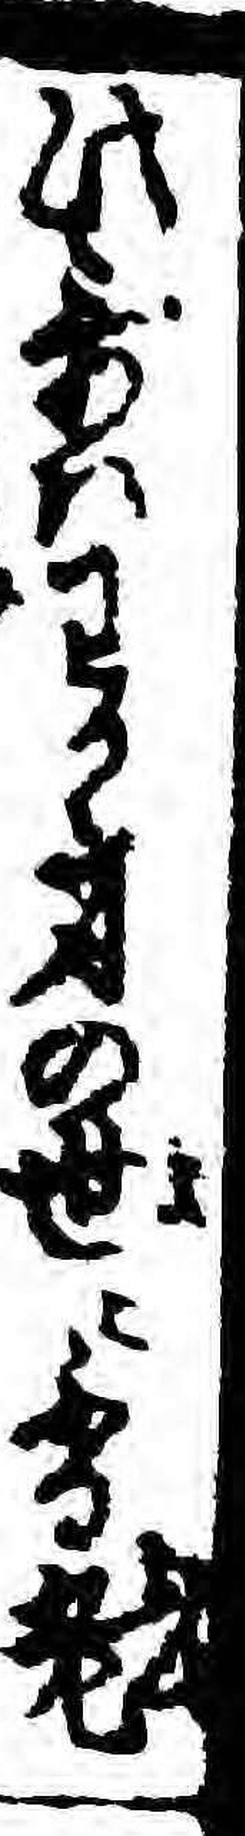此哥はわか身の世にふる老い
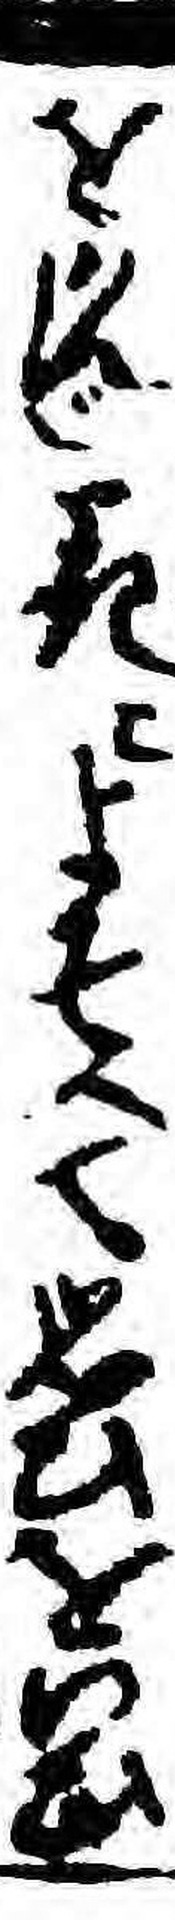をかんじ花によそへて思ひをいひ
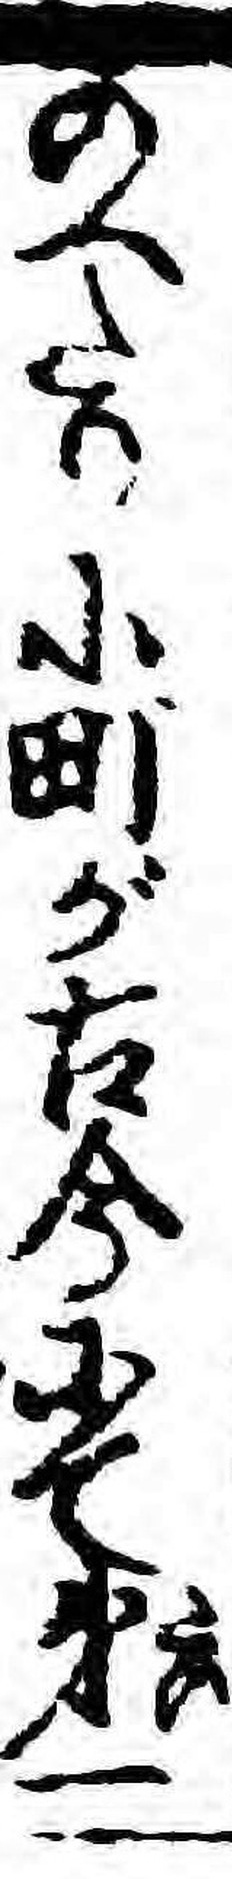のへたり小町が古今にて第一
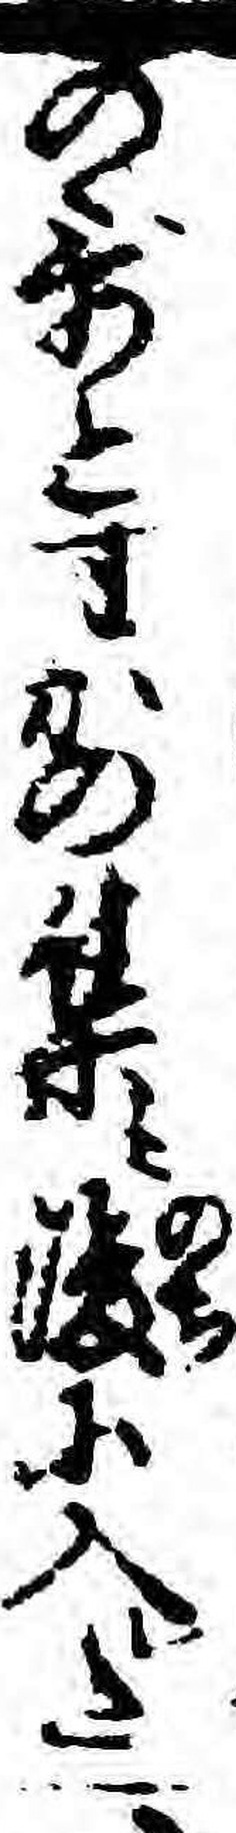の歌とすかの集に後に入れた
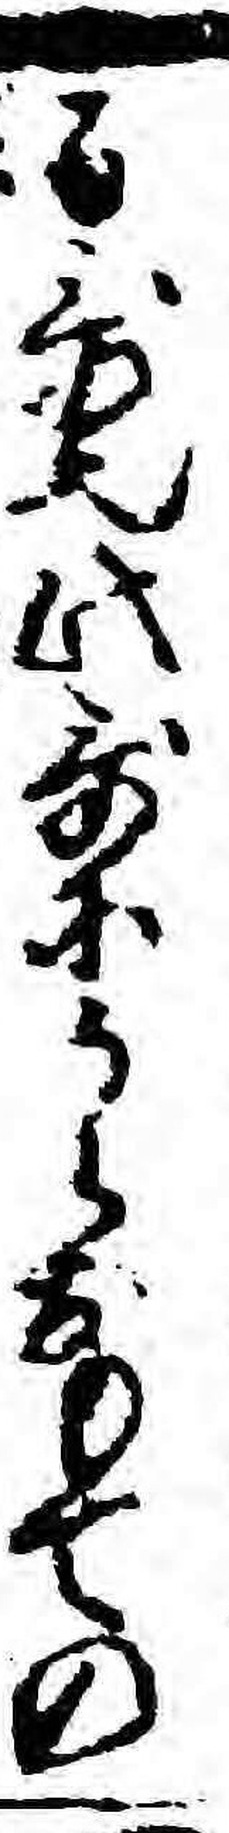る哥也此哥にうらおもての
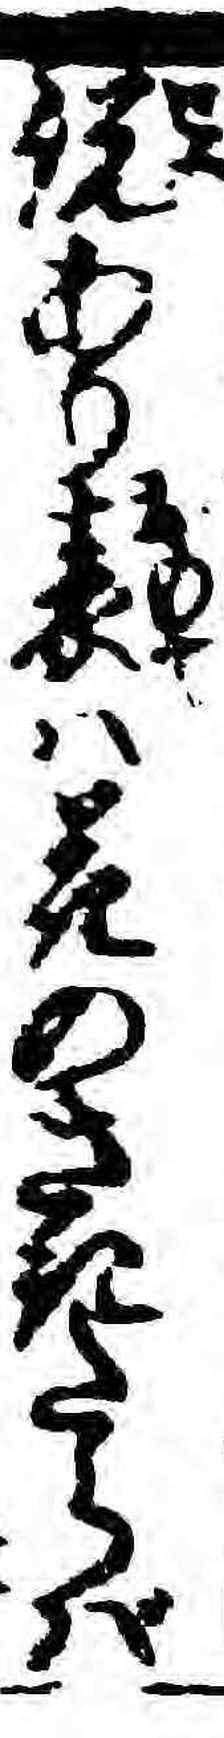説あり表は花のさきたらば
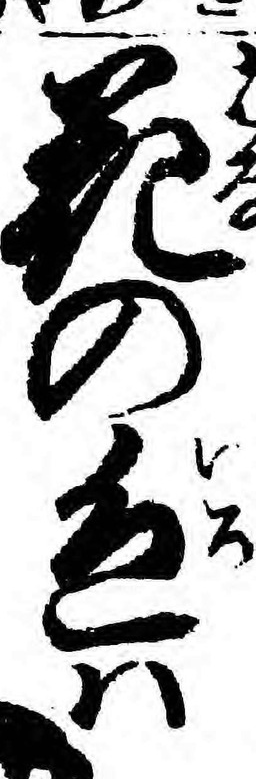花の色は
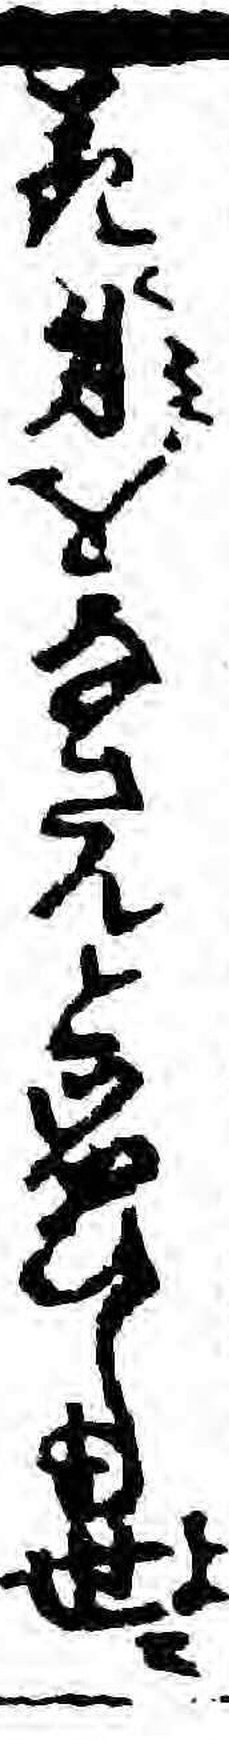花に身をなさんと思ひしも世に
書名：頭書和歌注譯／壽賀多百人一首小倉錦
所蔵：国文学研究資料館
